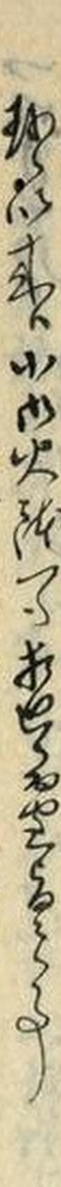越候以来ハ小御火鉢一ツ相廻候而宣旨ニ候事
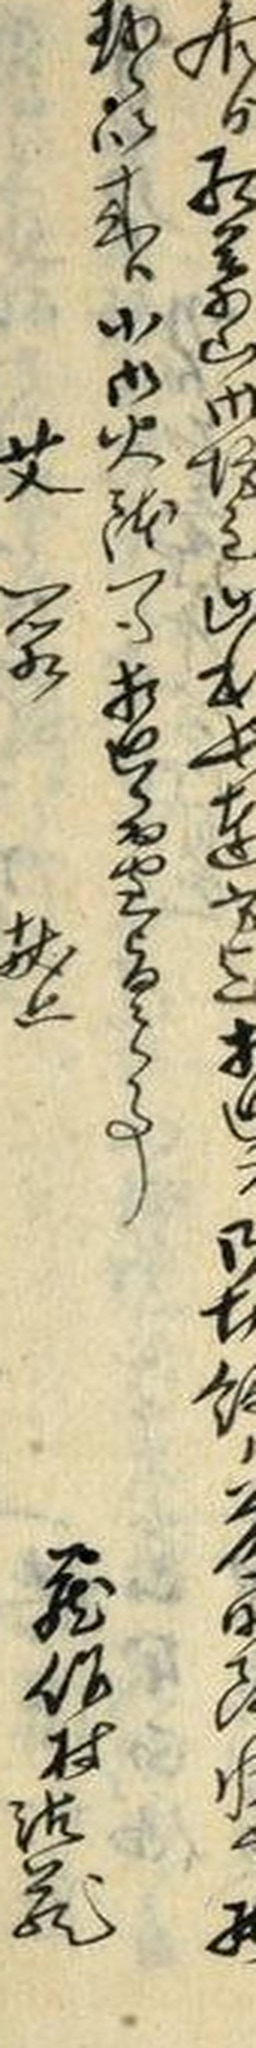艾一箱献上蔵作村銀蔵

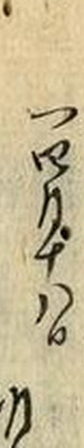一四月十八日
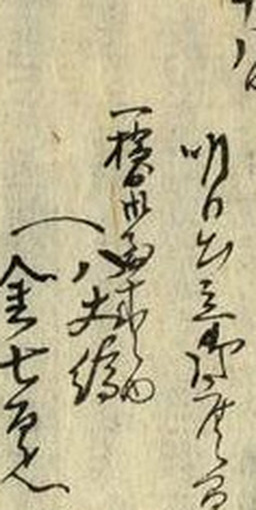一橋ゟ御到来之内
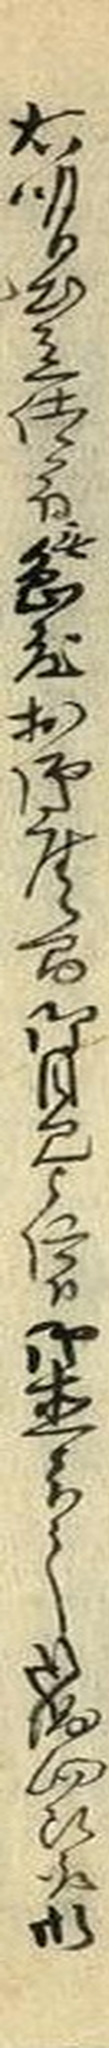右明日出立仕候ニ付無急度御座之間御目見被仰御直々被下之御側向頭取御
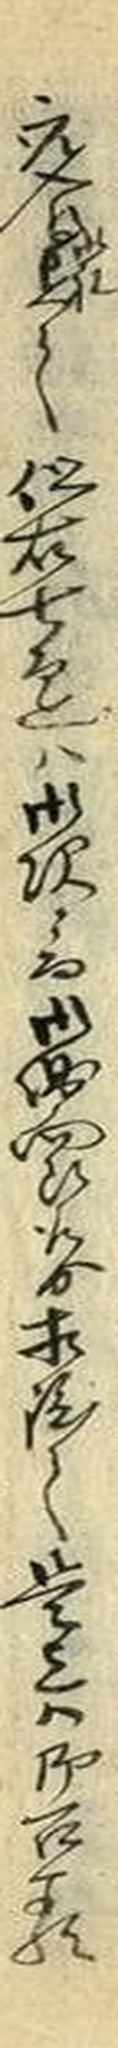取合御礼有之但右七百疋ハ御次ニ而御側向頭取ゟ相渡之是迄ハ御召類
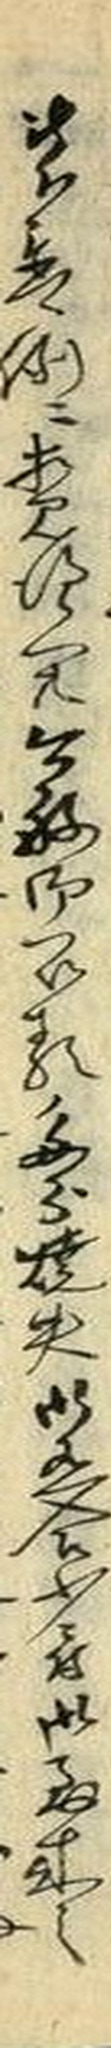被下置候例ニ相見得候へ共今般御召類多分焼失御有合少ニ付御到来之
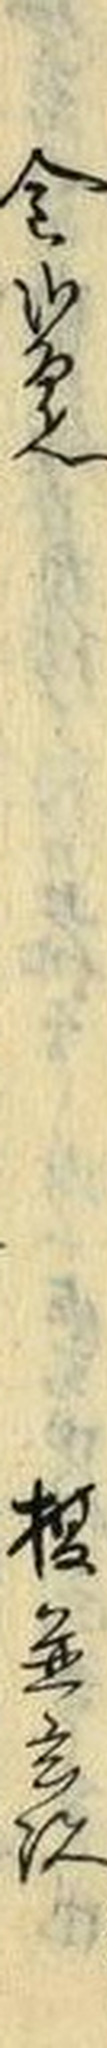金弐百疋榎並玄沢
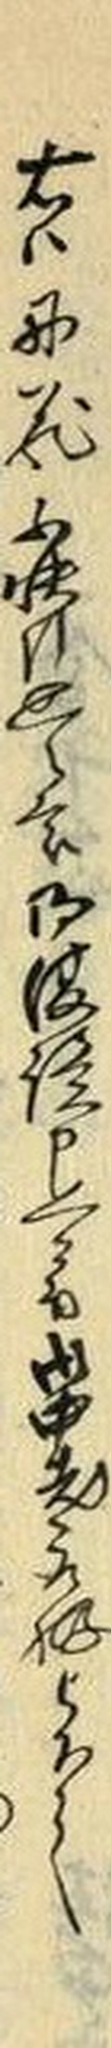右ハ丹蔵不快引込候節御講談申上候付御中老被取扱被下之
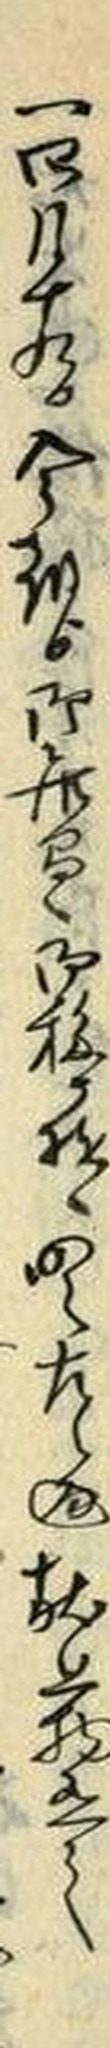一四月十九日今朝ゟ御居間へ御移被遊候仍之左之通献上物有之
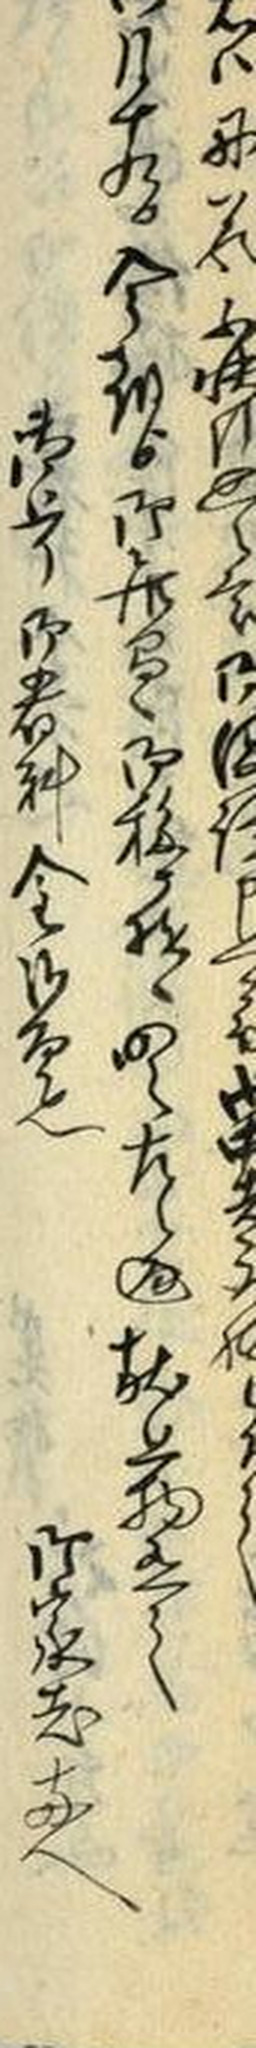御上り御肴料金弐百疋御家老両人
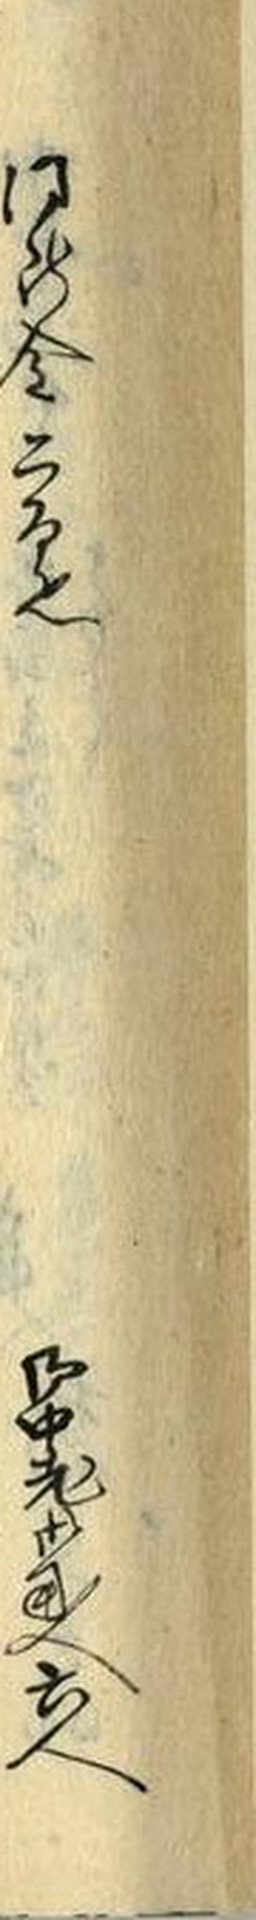同断金二百疋御中老御用人六人
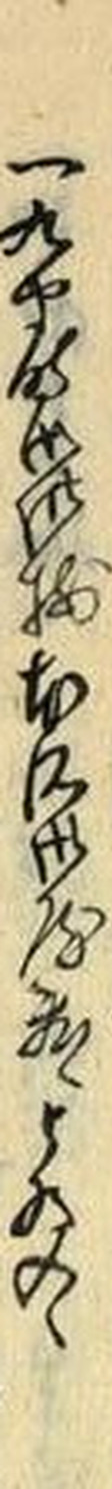一九半時御供揃本所御屋敷へ被為入候
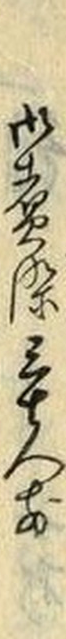御煮染三十人前
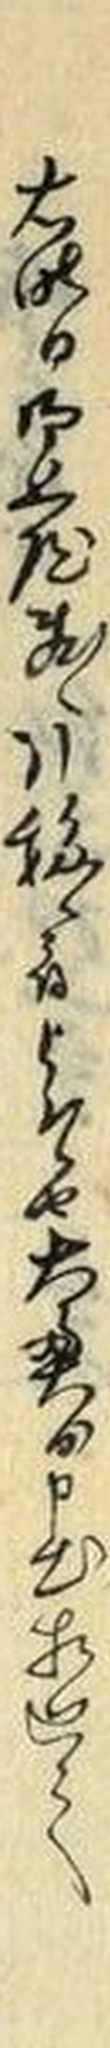右昨日御上屋敷へ引移候ニ付被下候由大奥ゟ申出相廻之
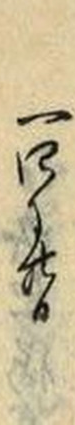一四月廿日
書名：少傅日録抄（斉承付側向頭取日記、在府）
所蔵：福井県文書館 Fukui Prefectural Archives
